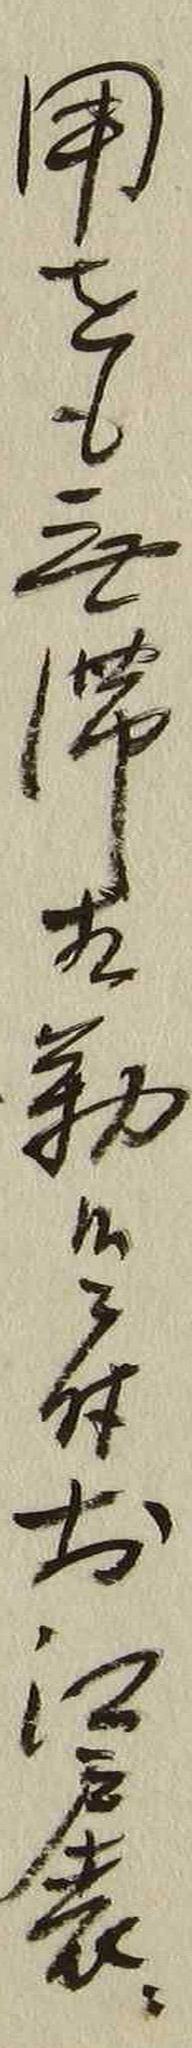用をも無滞相勤候ニ於江戸表ニ
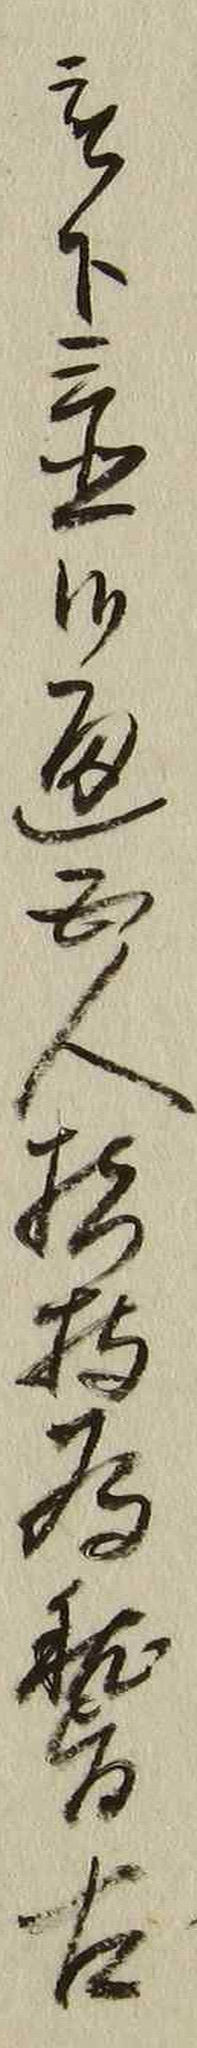被下置候通五人扶持為稽古
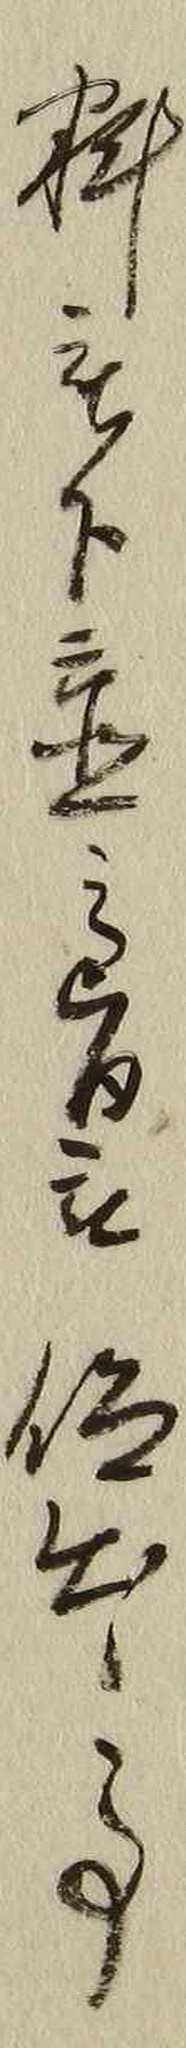料被下置之旨被仰出候事
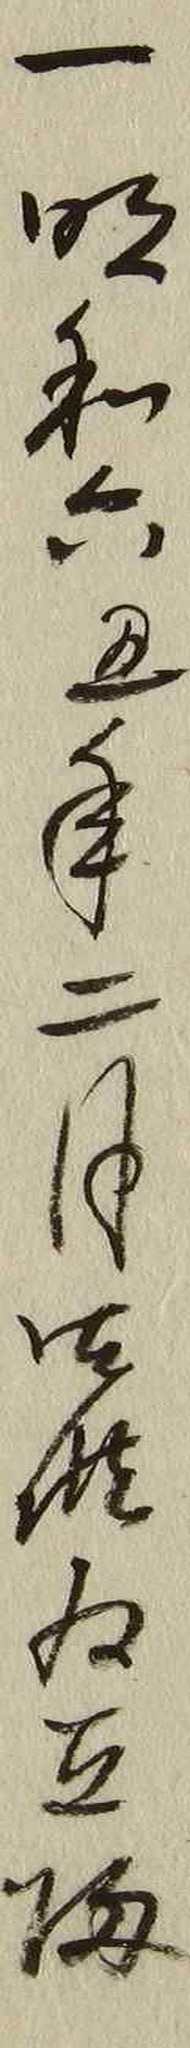一明和六丑年二月御供為立帰
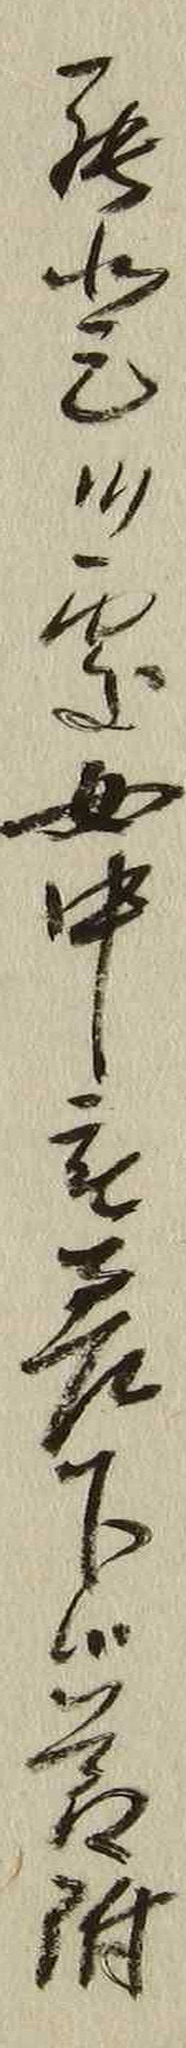罷登候処女中被差下候節附
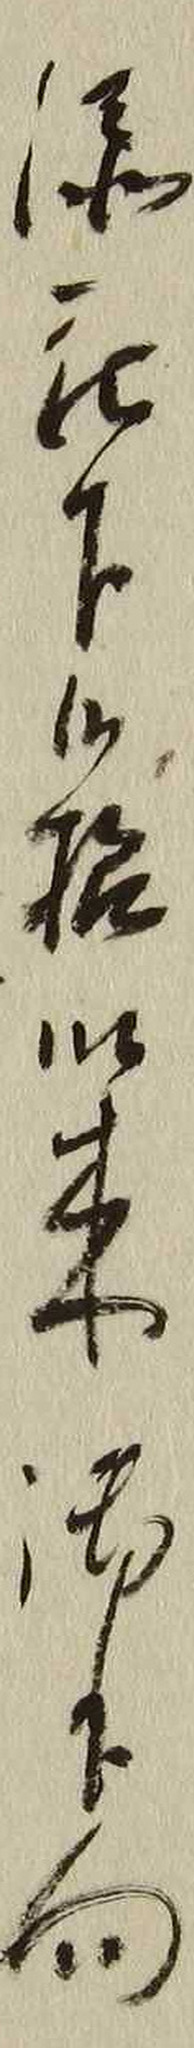添罷下候様以来御下向
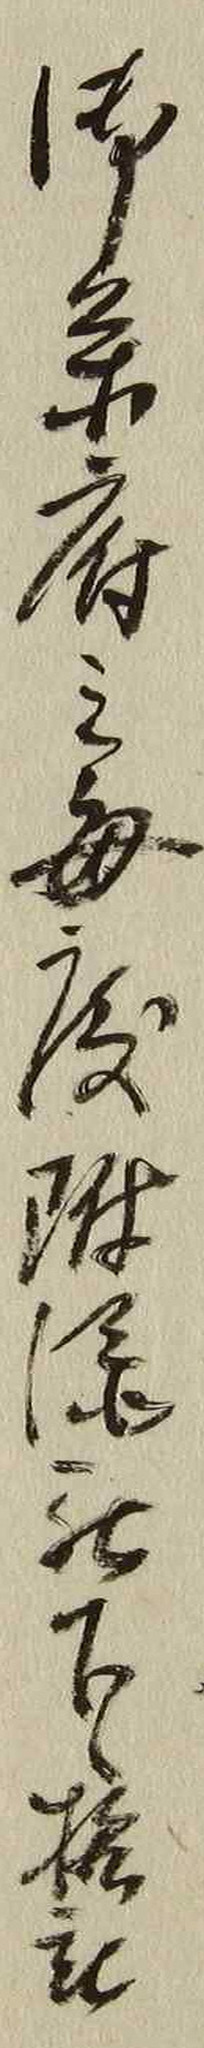御参府之毎度附添罷下候様被
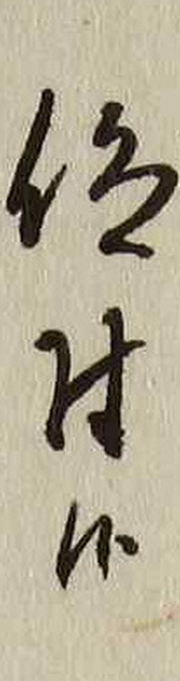仰付候
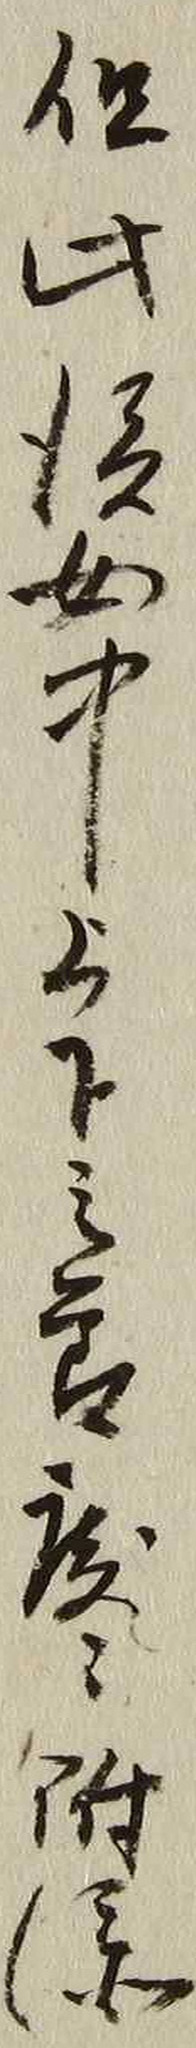但此後女中上下之節度々附添
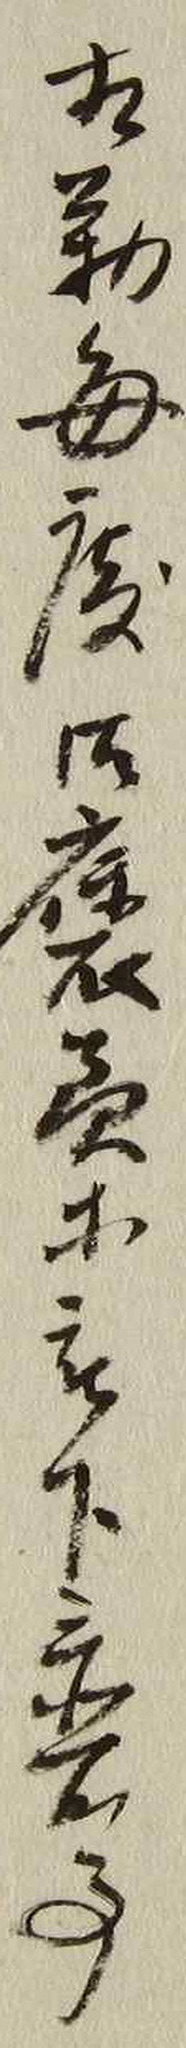相勤毎度御褒美等被下置候事
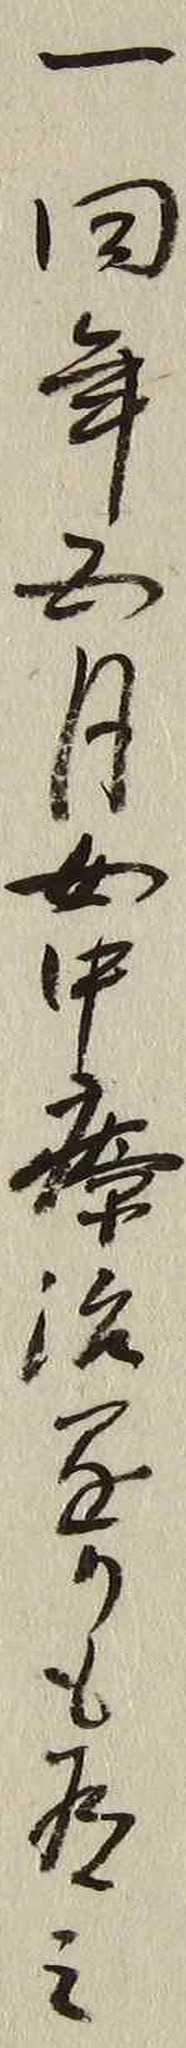一同年五月女中療治懸りも有之
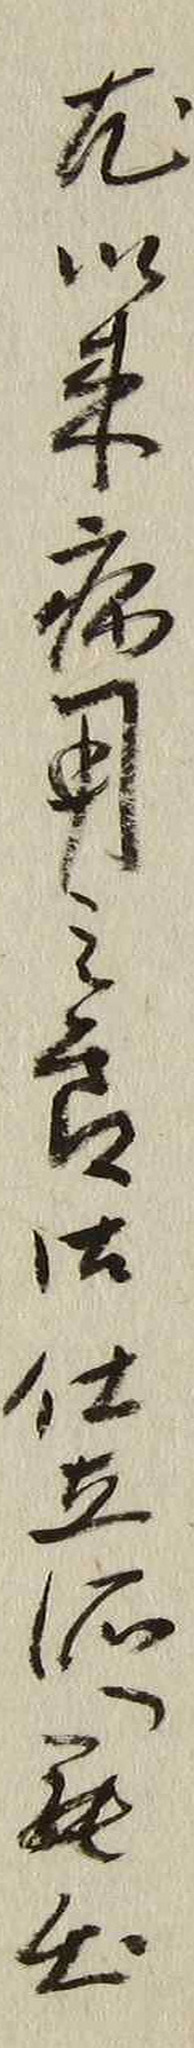尤以来病用之節御仕立所へ罷出
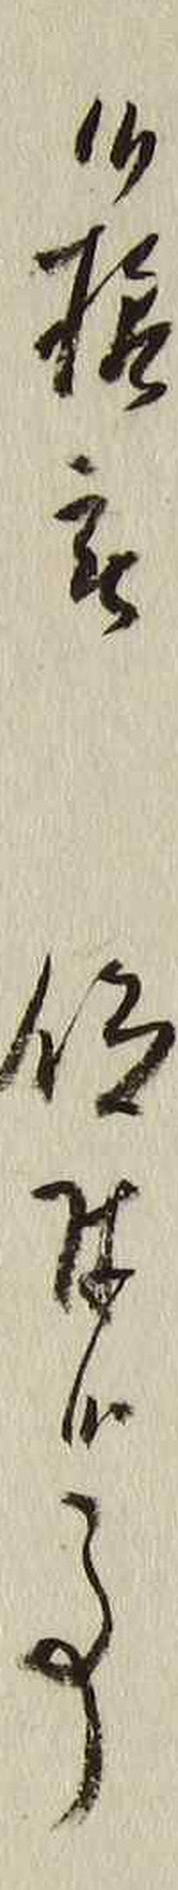候様被仰付候事
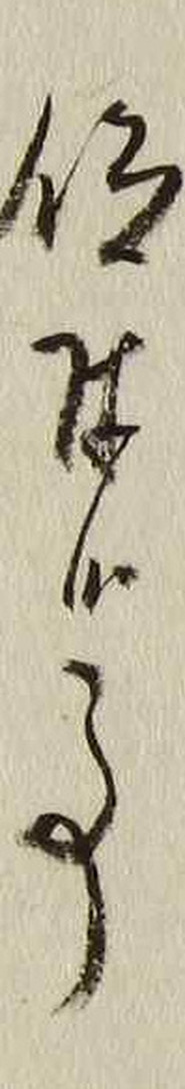仰出候事
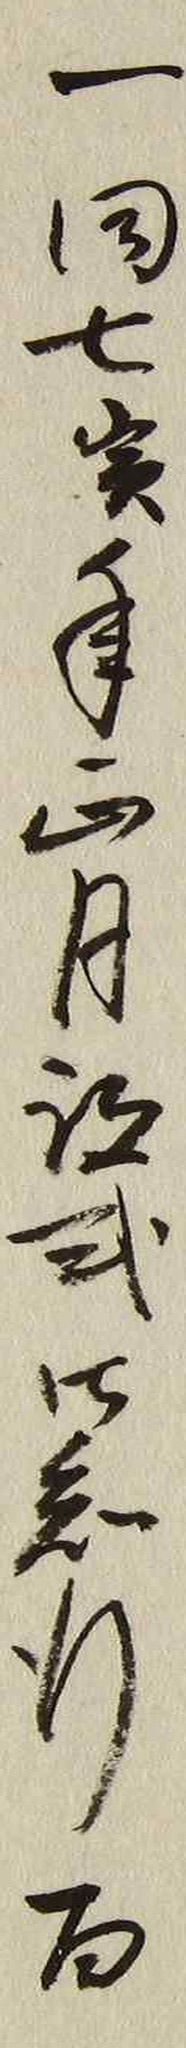一同七寅年正月跡式御知行百
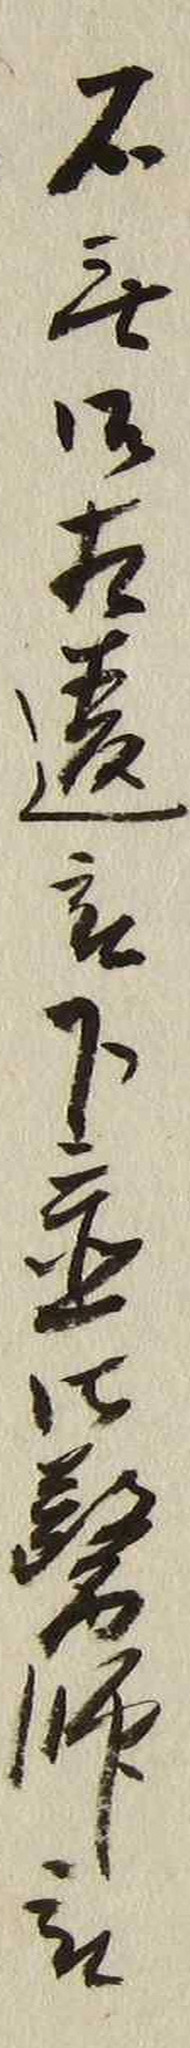石無御相違被下置御医師被
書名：諸士系譜　巻之353　す之部3
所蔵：会津若松市立会津図書館
